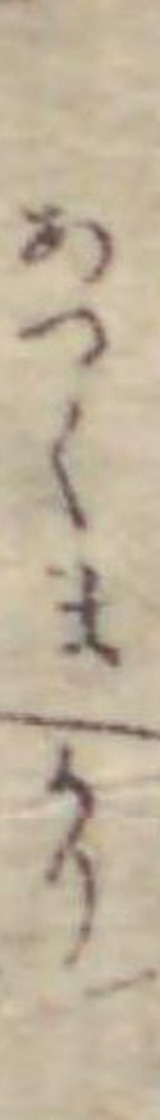あつくまかり
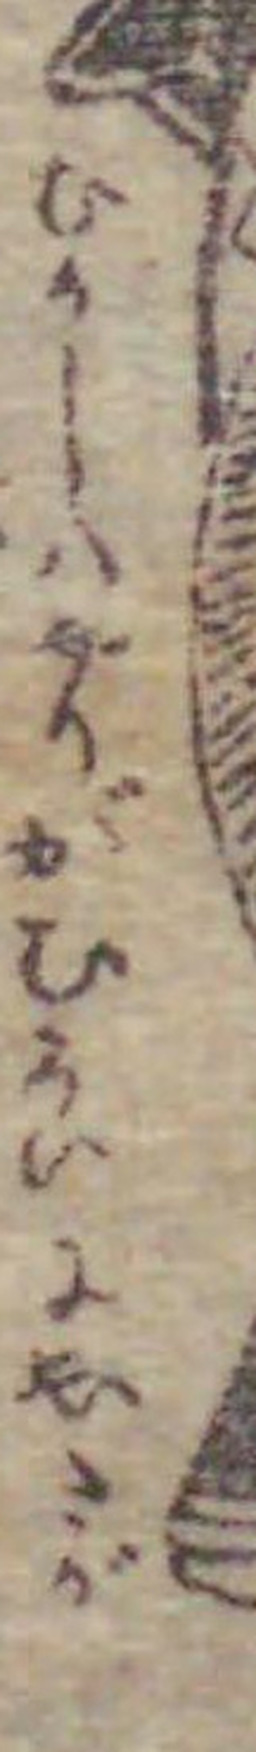むかしはやりがむかいにきたが
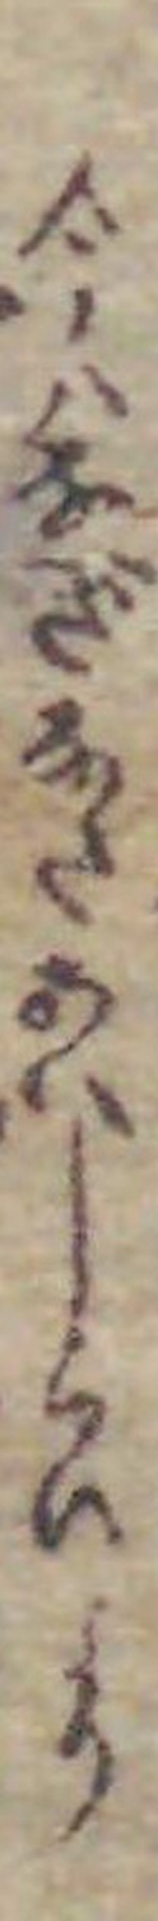今はなぎなたあは？しらいより
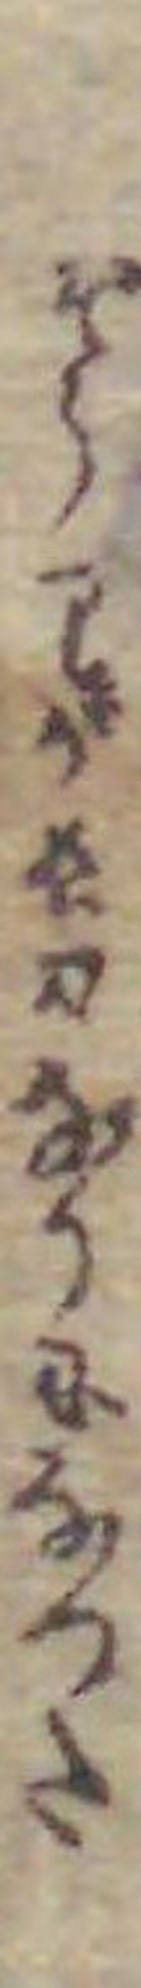ぞうりが長刀なり？に？なつた

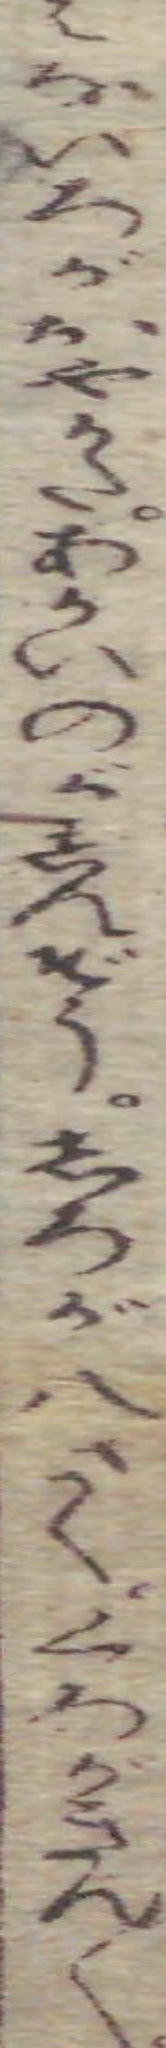はないろがおやかた。あかいのがしんぞう。しろが八さく。くろがきん〳〵。
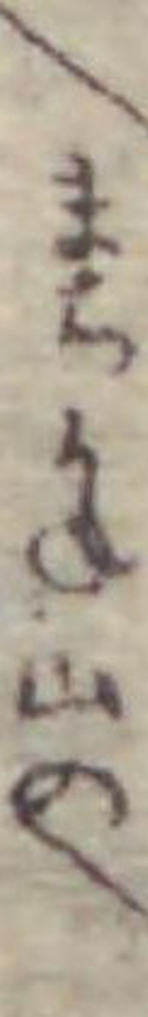まちかね山の
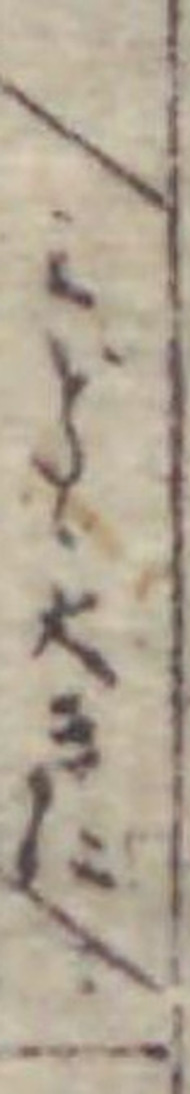みども大きに
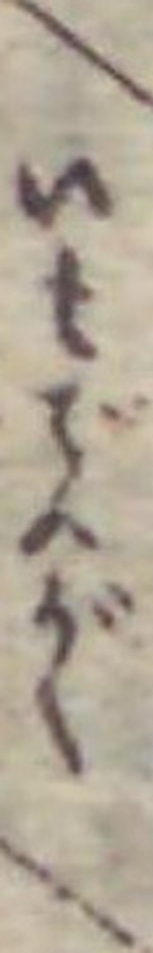いもでんがく
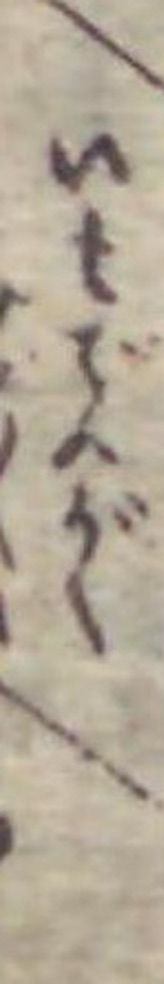いもでんがく

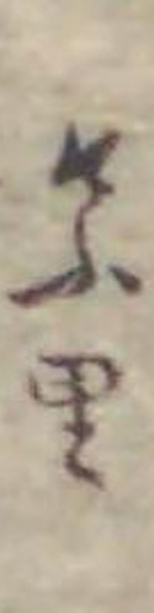けふ里
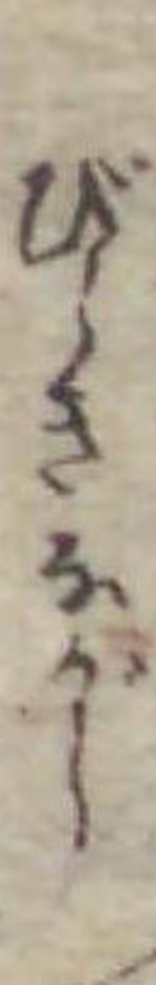びらきながら
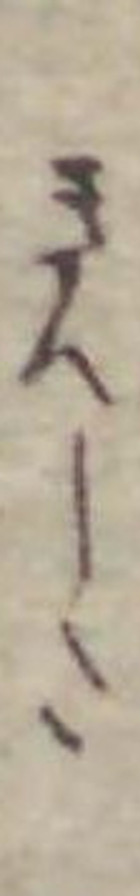きんした
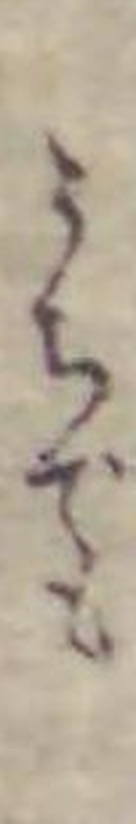うちでも
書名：郭𦽳費字尽 : 3巻
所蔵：国立国会図書館 National Diet Library, JAPAN
